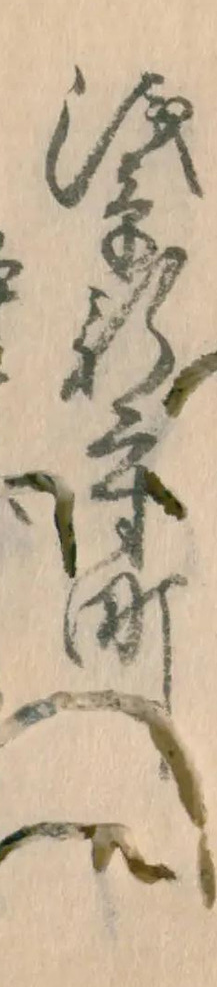浅草新寺町
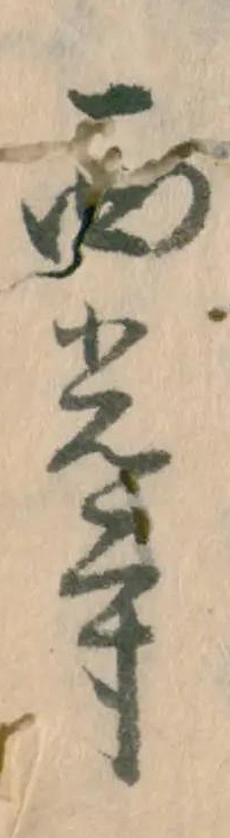西光寺

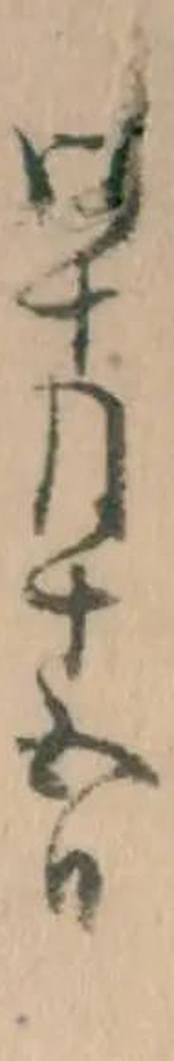同十月十五日
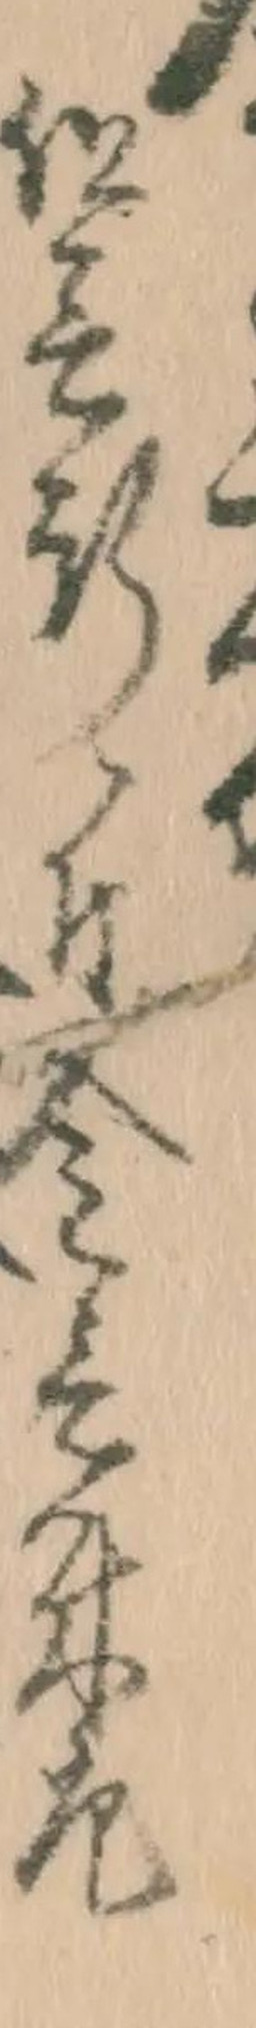但壱軒ニ付金壱朱宛
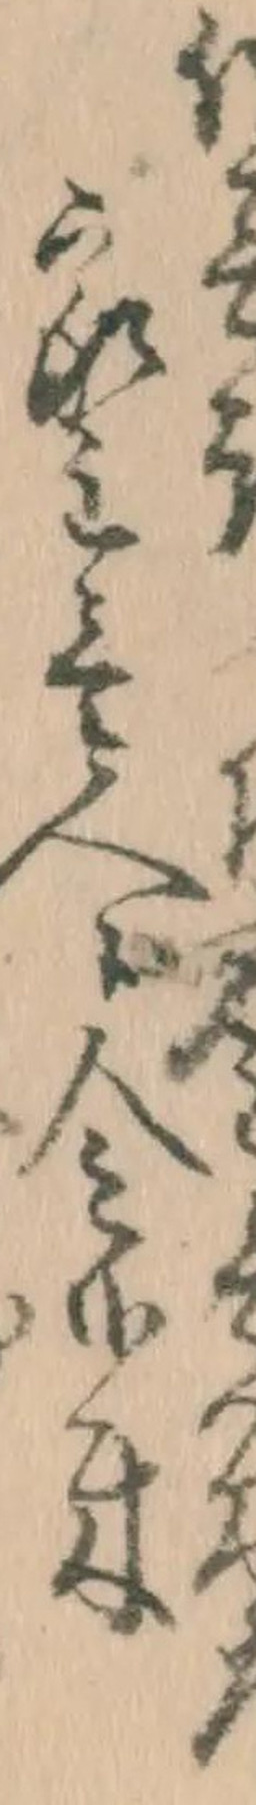家主壱人え金弐朱
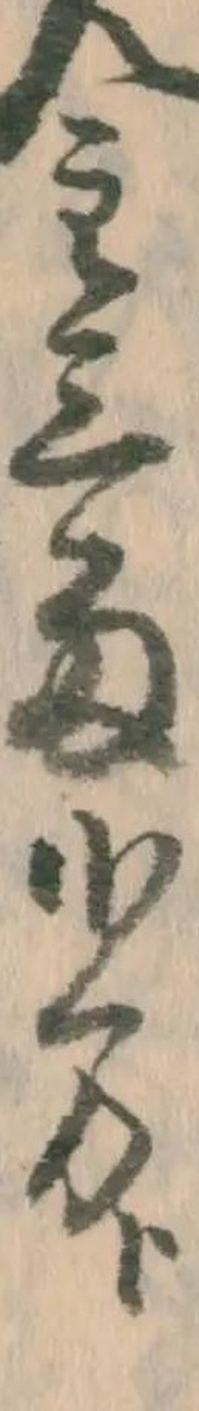一金三両弐分ト
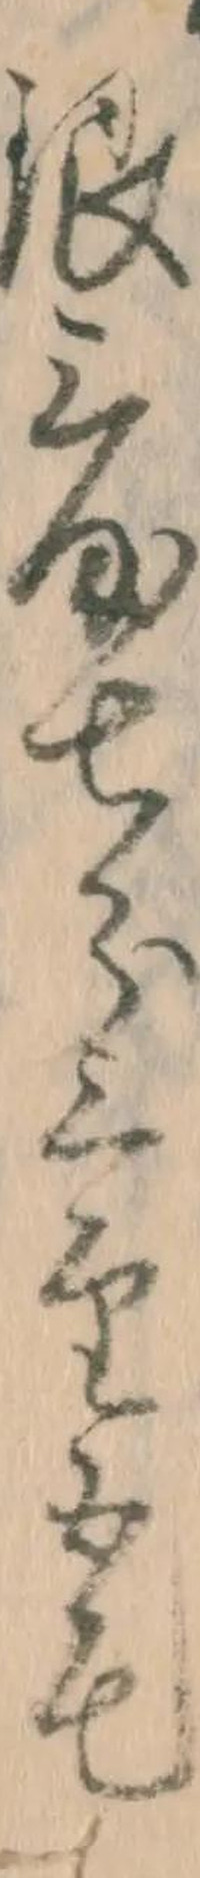銀三匁七分三厘五毛
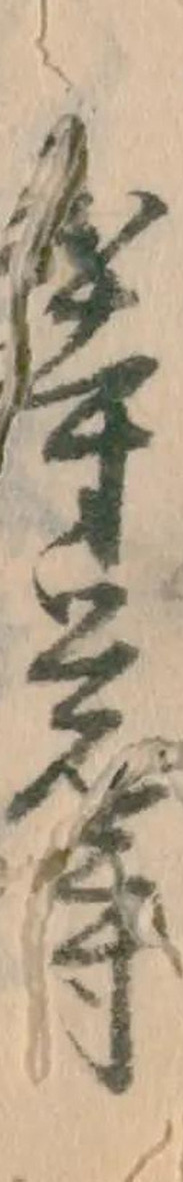等覚寺
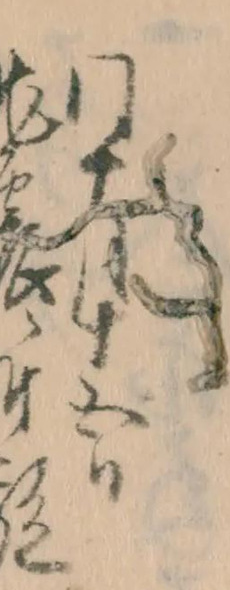同十月十五日
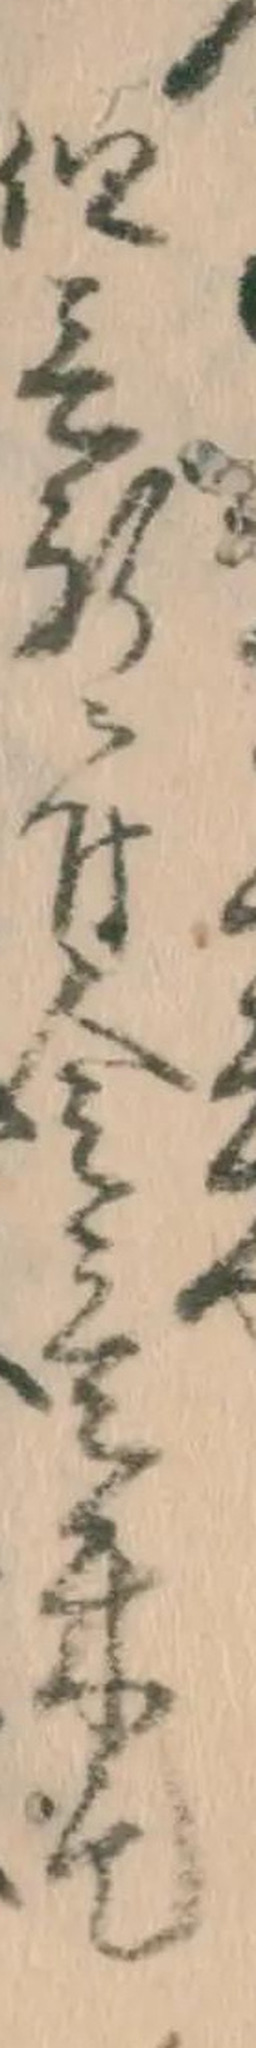但壱軒ニ付金壱朱宛
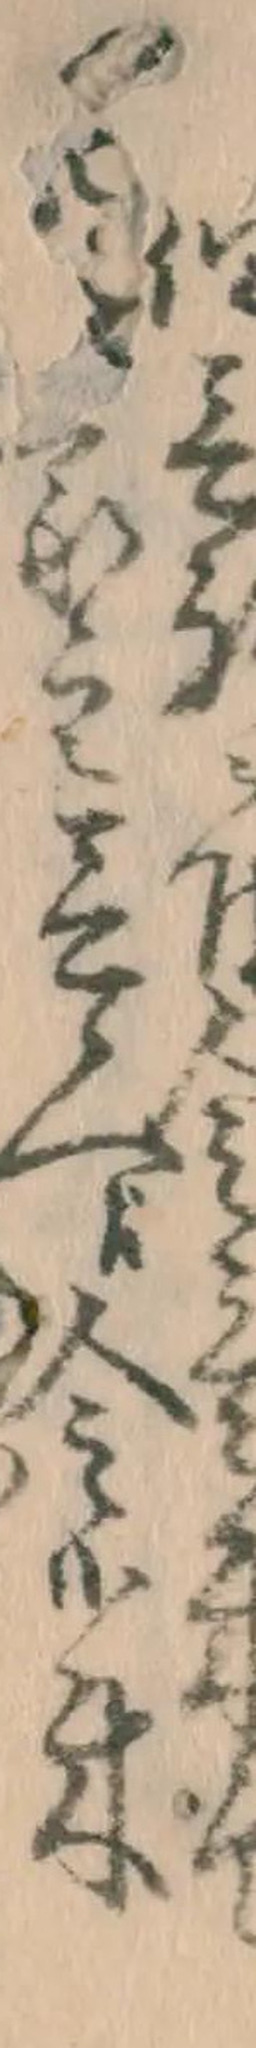家主壱人え金弐朱
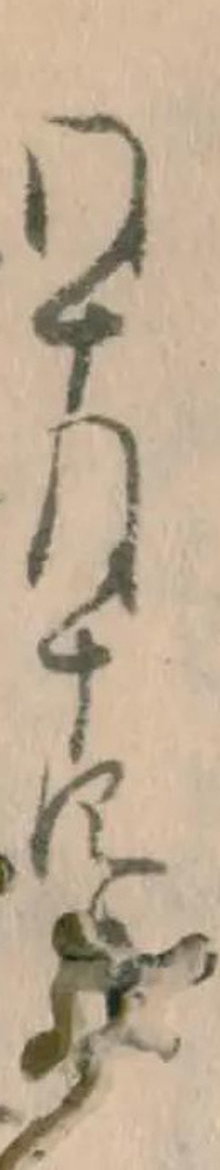同十月十四日
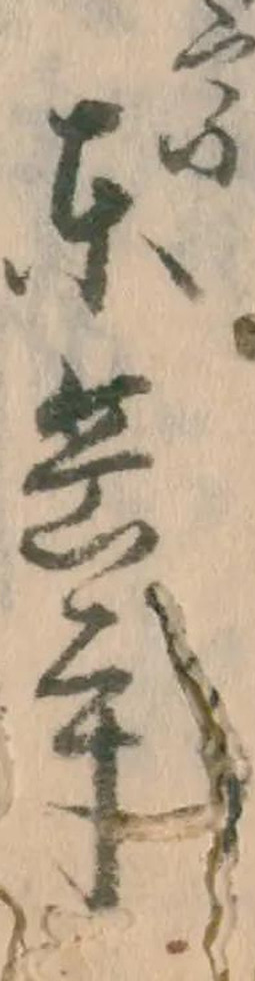東岳寺
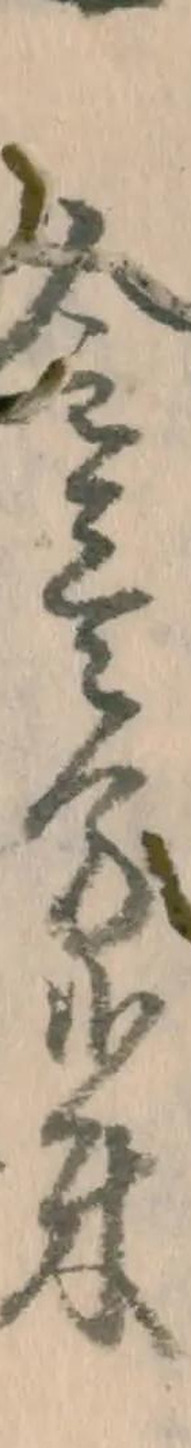一金壱分弐朱表店
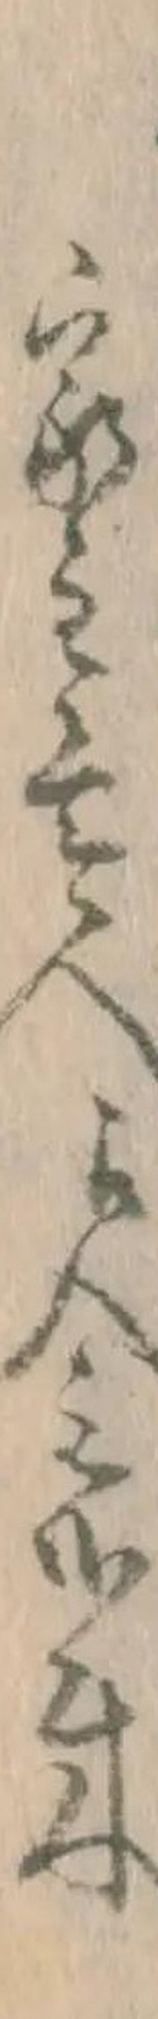家主壱人え金弐朱
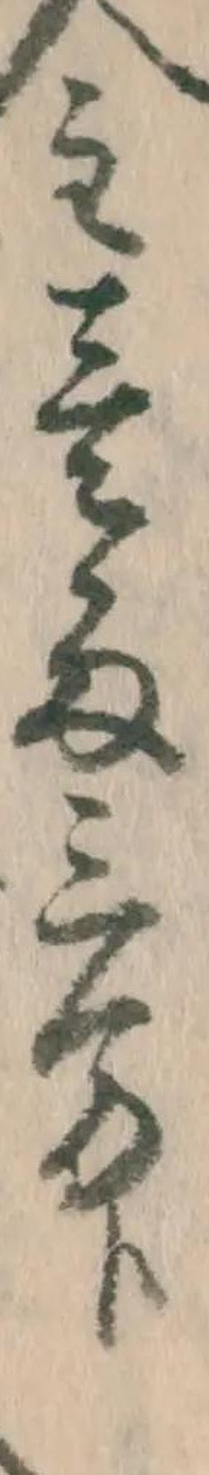一金壱両三分ト
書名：武家方并寺院等ニテ施差出候一件
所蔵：国立国会図書館 National Diet Library, JAPAN
